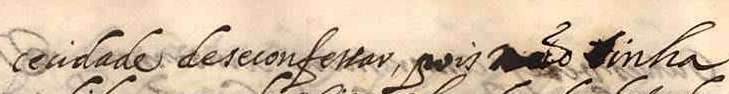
cecidade de se confessar, pois naõ tinha
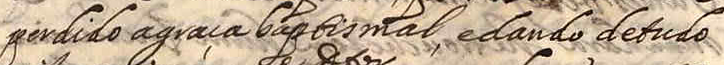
perdido a graça baptismal, e dando de tudo
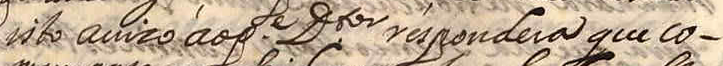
isto auizo ao p.e D.tor respondera que co
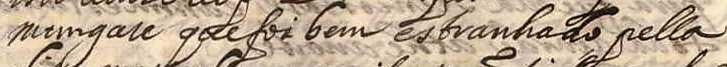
mungase que foi bem estranhado pella
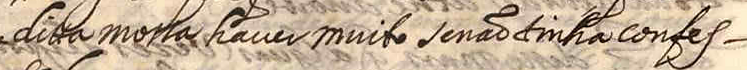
ditta mossa hauer muito se naõ tinha confes
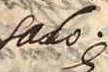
sado.
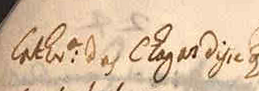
Cathr.a das Chagas disse q̄
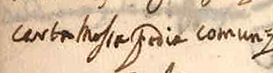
certa mossa podia comun
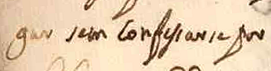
gar sem confessarse por
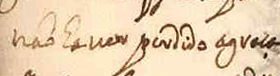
naõ hauer perdido a graça
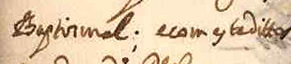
Baptismal; e com este ditto
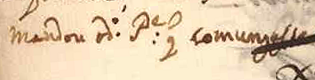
mandou o d.o P.e q̄ comungasse
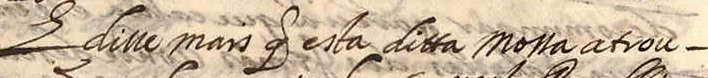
E disse mais q̄ esta ditta mossa a trou
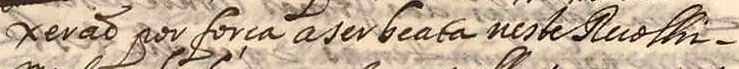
xeraõ por força a ser beata neste Recolhi
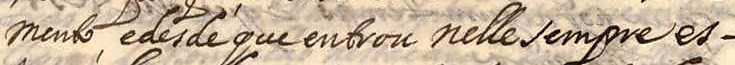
mento, e desde que entrou nelle sempre es
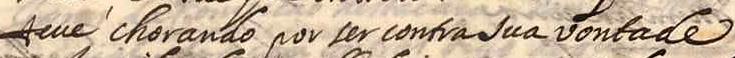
teue chorando por ser contra sua vontade
